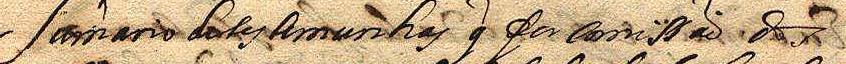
Sum̄ario de testemunhas q̄ por comissão dos
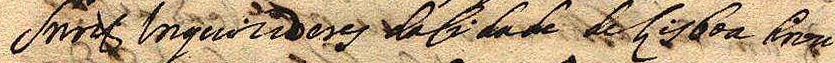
Snres Inquizidores da Cidade de Lisboa tirou
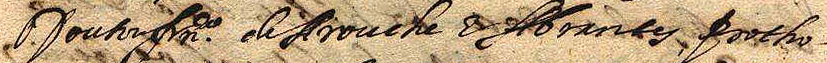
o Doutor frn.co de Arouche E Abrantes, protho
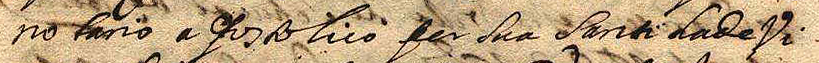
notario apostolico per sua Santidade Vi
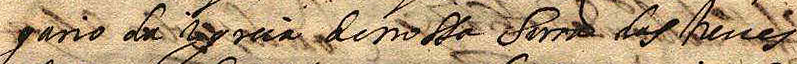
gario da Igreja de nossa Senrā das Neues
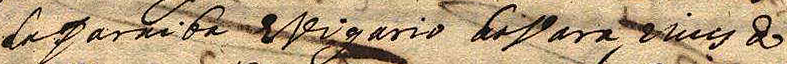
da paraiba E Vigario da Vara, e iuis do
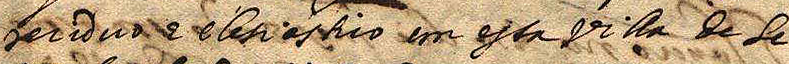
reziduo Eclesiastico em esta Villa de Se
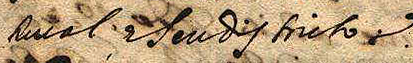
tuual, E seu districto.-
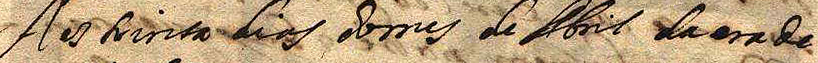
Aos trinta dias do mes de Abril da era de
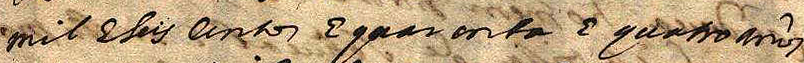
mil E seiscentos E quarenta E quatro anōs
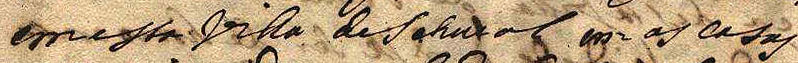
em esta Villa de Setuual em as casas
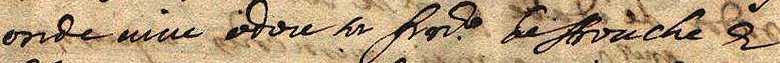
onde uiue o doutor frn.co de Arouche E
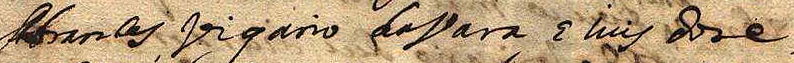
Abrantes, Vigario da Vara, E Iuis do re
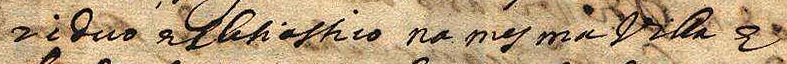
ziduo Eclesiastico na mesma Villa E
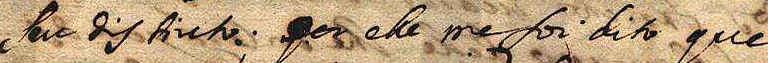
Seu districto; por elle me foi dito que
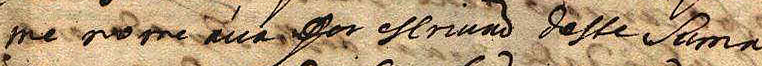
me nomeaua por escriuão deste Suma
